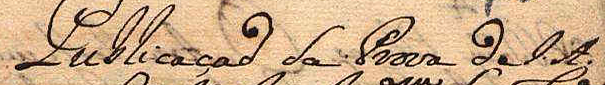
Publicaçaõ da Prova de I. A.
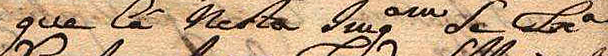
que há nesta Imq.am de Lxa
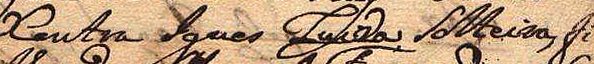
Contra Ignes Luiza, solteira, fi
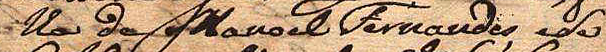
lha de Manoel Fernandes, e de
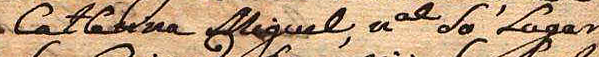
Catherina Miguel, nal do Lugar
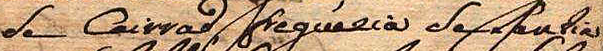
de Cairraõ, freguezia de santia
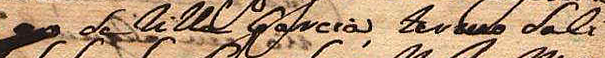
go de Villa Garcia, termo da Ci
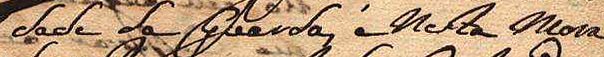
dade da Guarda, e Nesta Mora
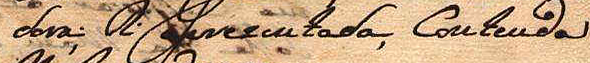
dora; R. aprezentada, Conteuda
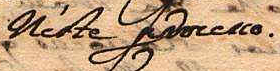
Neste processo.
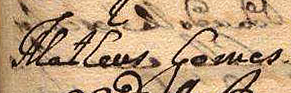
Matheus Gomes.
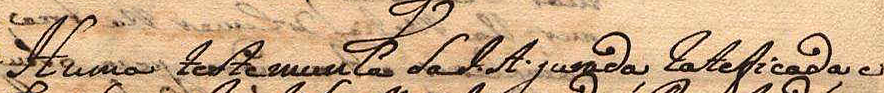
Huma testemunha da I. A. jurada Rateficada, e
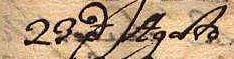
23 d̄ Agosto
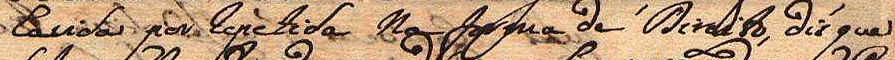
havida por Repetida Na forma de Direito, dis que
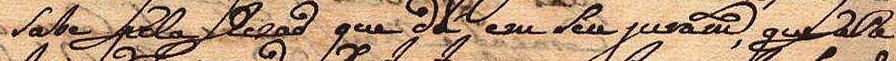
sabe pela Rezaõ que dá em seu juramto, que a Re
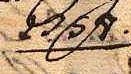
1758.
